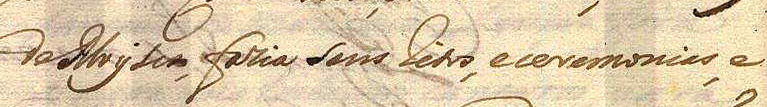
de Moyses, fazia seus Ritos, e ceremonias, e
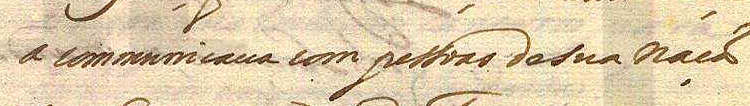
a communicaua com pessoas de sua nação
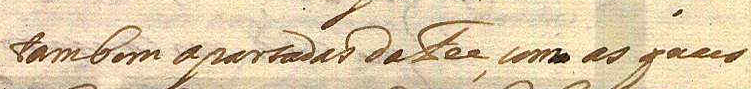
tambem apartadas da Fee, com as quais
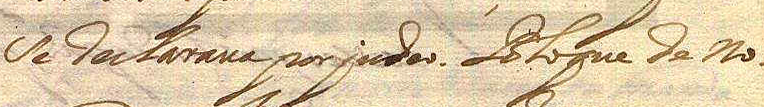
se declaraua por judeo. Polo que de no
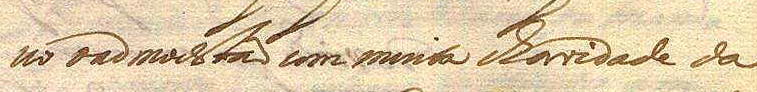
uo o admoestaõ com muita charidade da
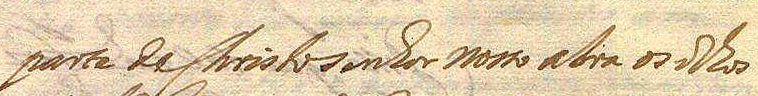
parte de Christo senhor nosso abra os olhos
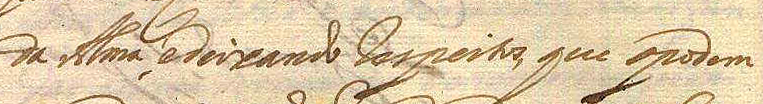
da Alma, e deixando Respeitos, que o podem
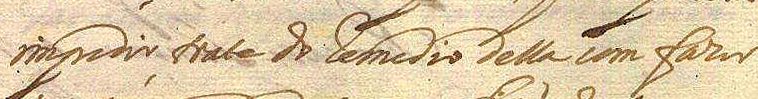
impedir trate do Remedio della com fazer
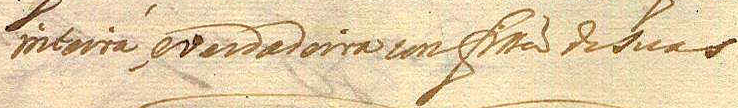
inteira, e verdadeira confissaõ de suas
